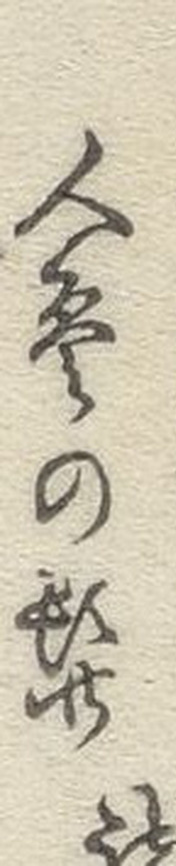人参の髭
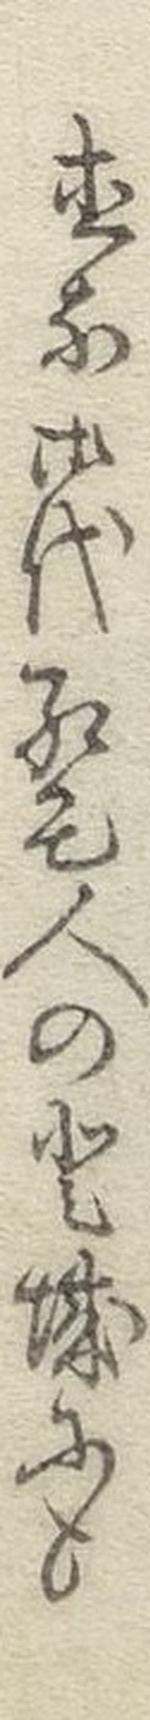直な御代紅毛人の登城にも
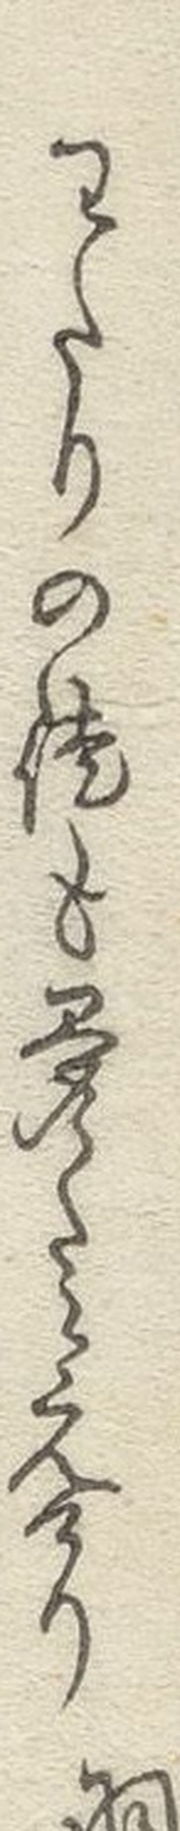わたりの徒も多くみえけり羽衣
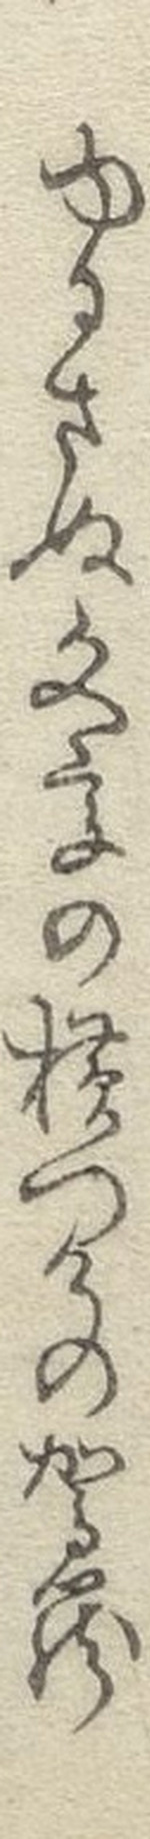ゆるさぬ文字の横つけの駕籠
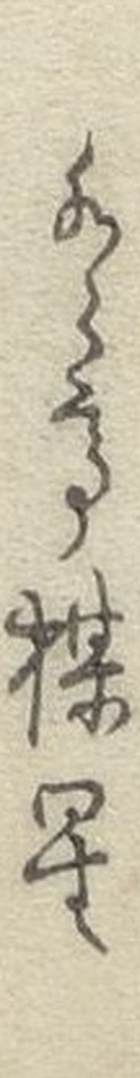水々亭楳星
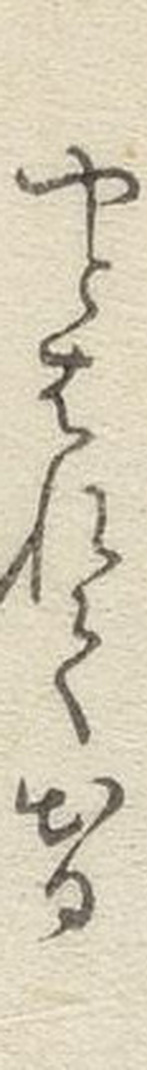やとはれて出る
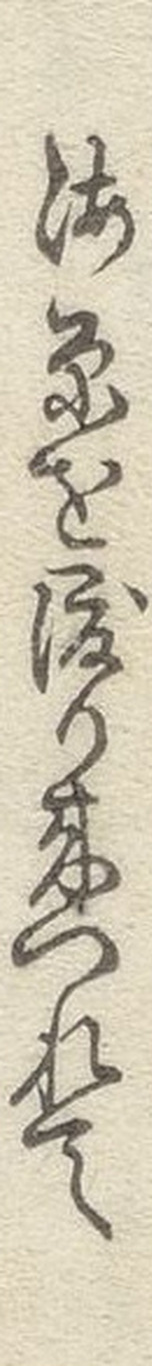海原を渡り来つれて
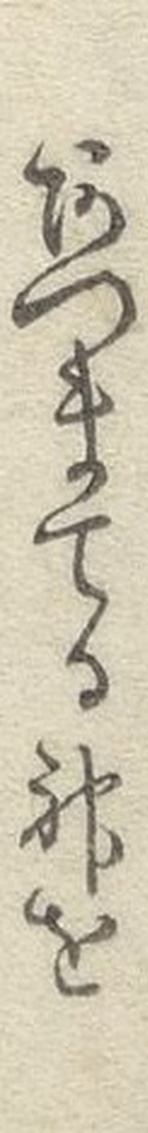あつまてる神を
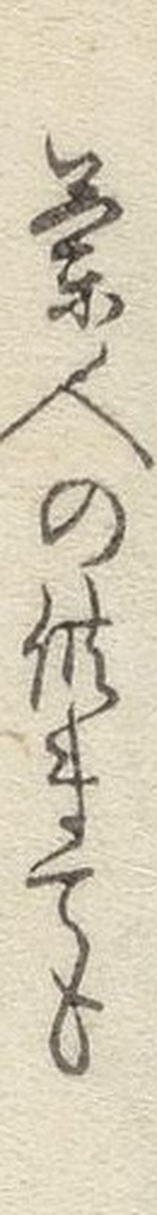蘭人の供まても
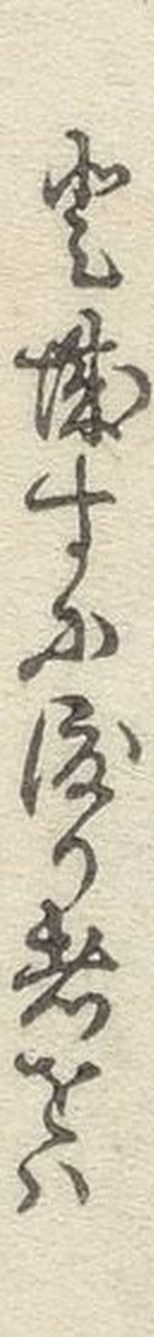登城すに渡り者をは
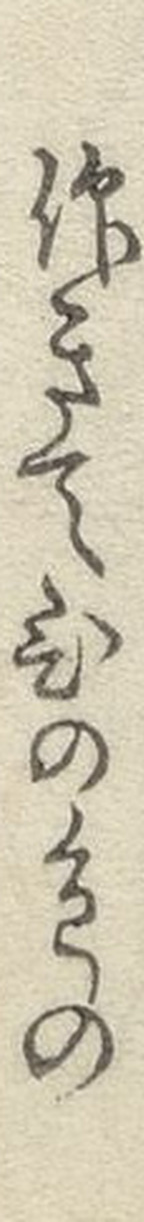仰きてひの色の
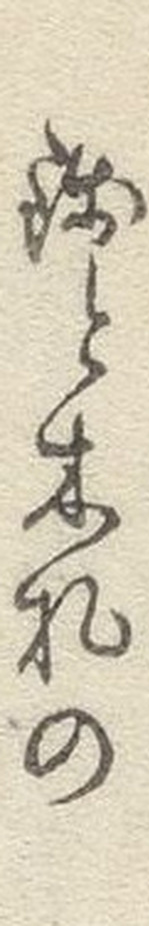銭と木札の
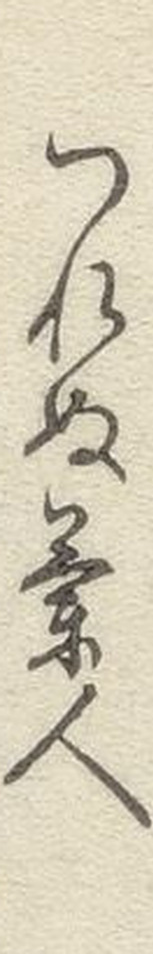つれぬ蘭人
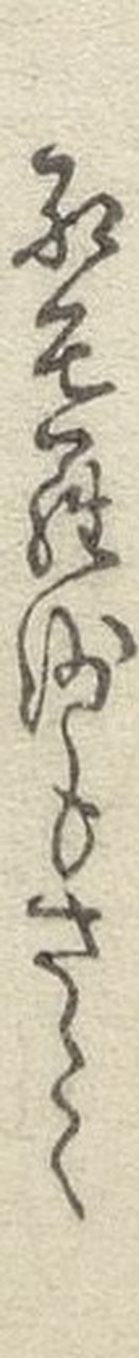紅毛羅紗もさこく
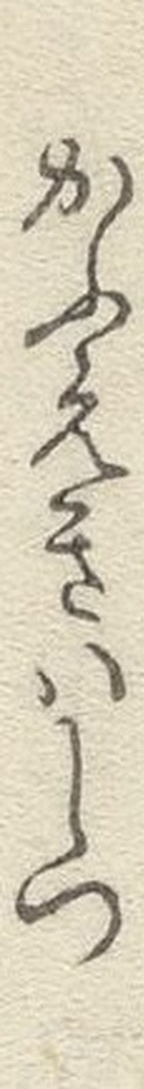かふえきはしつ
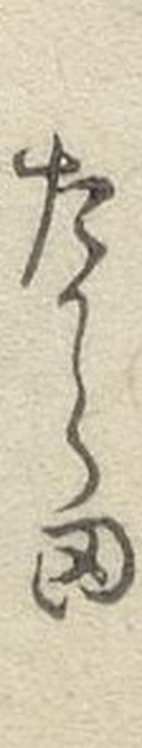たから田
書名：Picture Album of People with Kyōka (Light Verse) (Kyōka shiki jinbutsu 狂歌四季人物)
